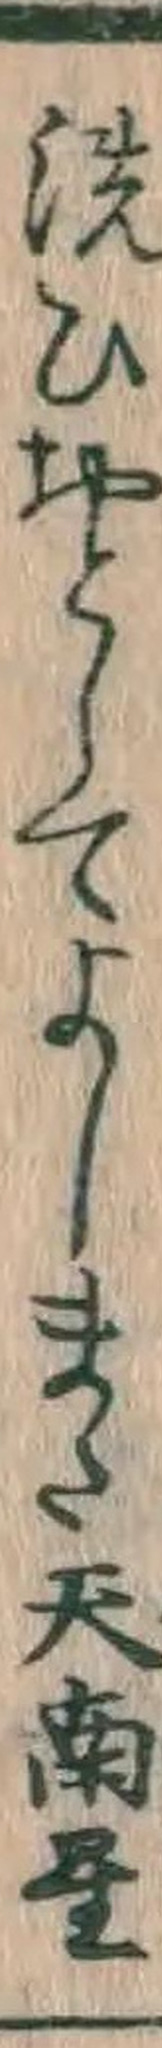洗ひおとしてよしまた天南星
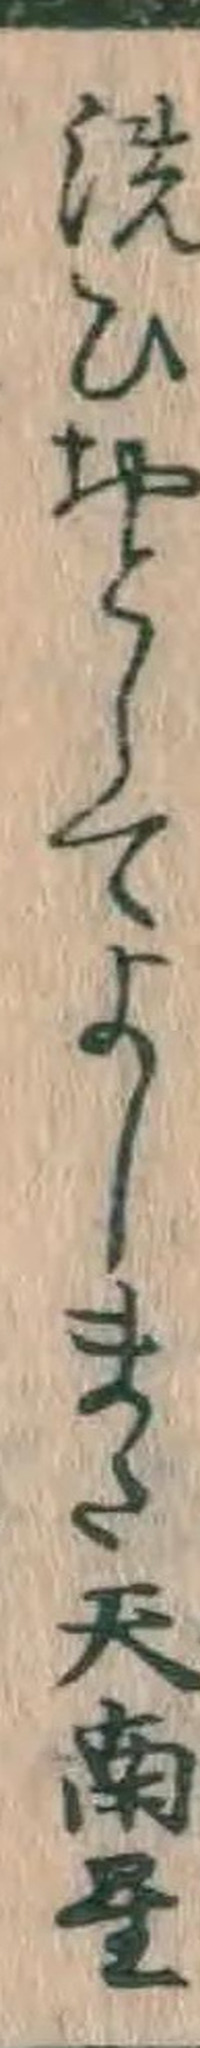洗ひおとしてよしまた天南星
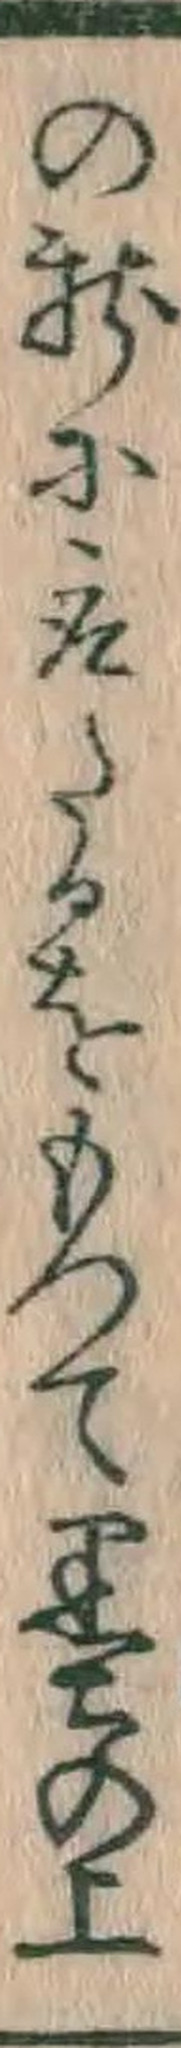の新に取たるをもつて墨の上
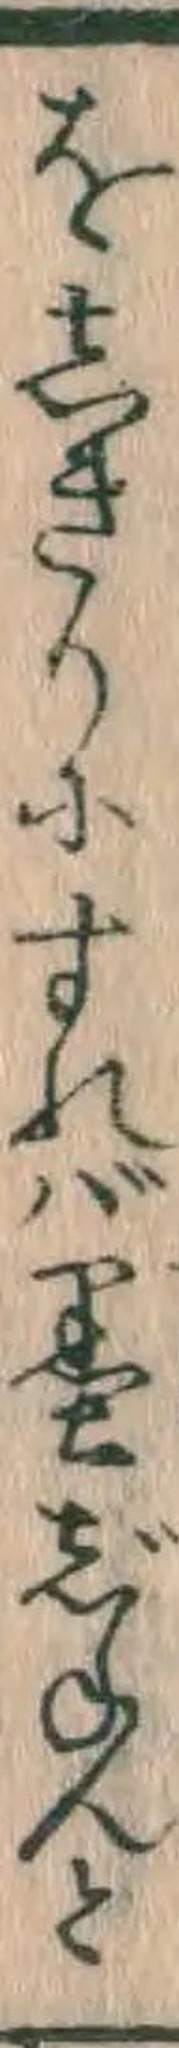をしきりにすれば墨じねんと
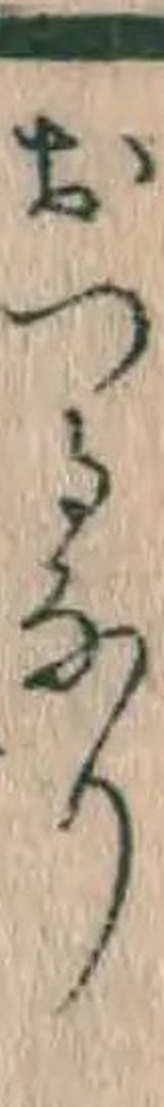おつるなり
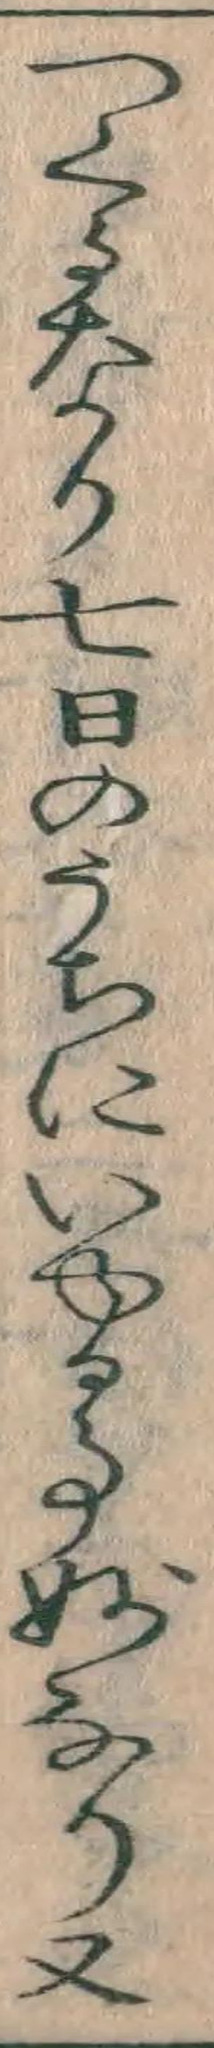つくるなり七日のうちにいゆる事妙なり又
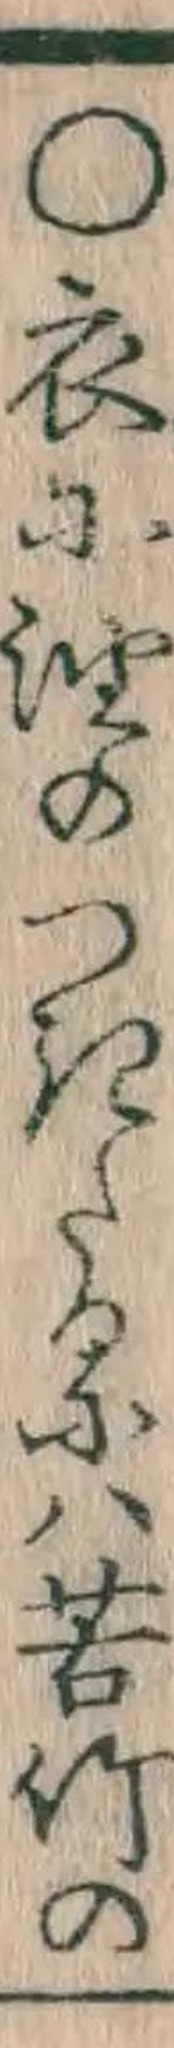○衣に油のつきたるには若竹の
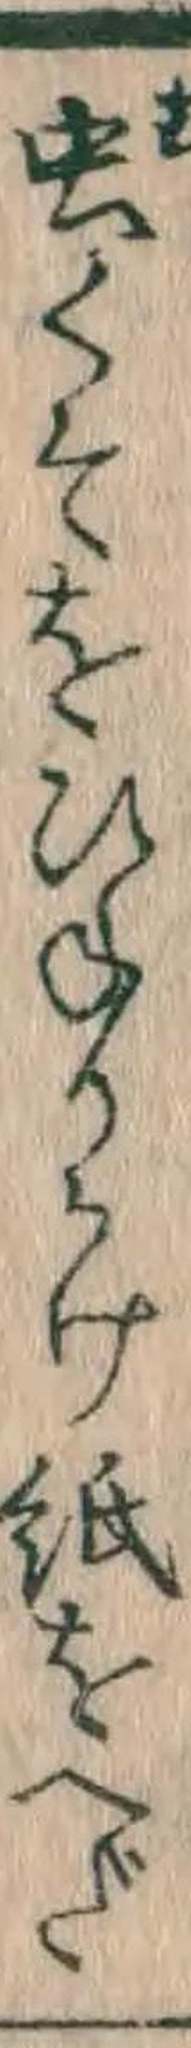虫くそをひねりかけ紙をへだ
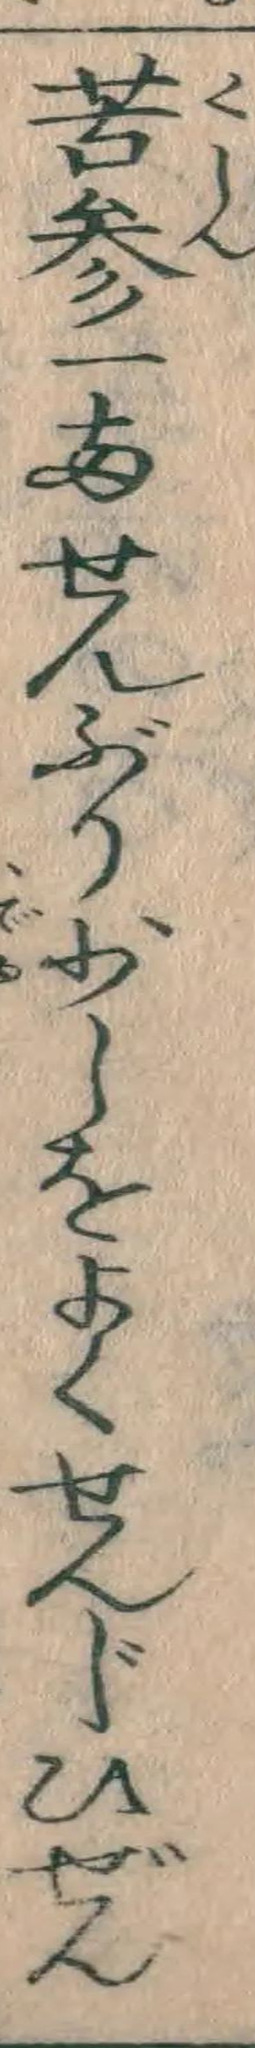苦参一両せんぶり少しをよくせんじひぜん
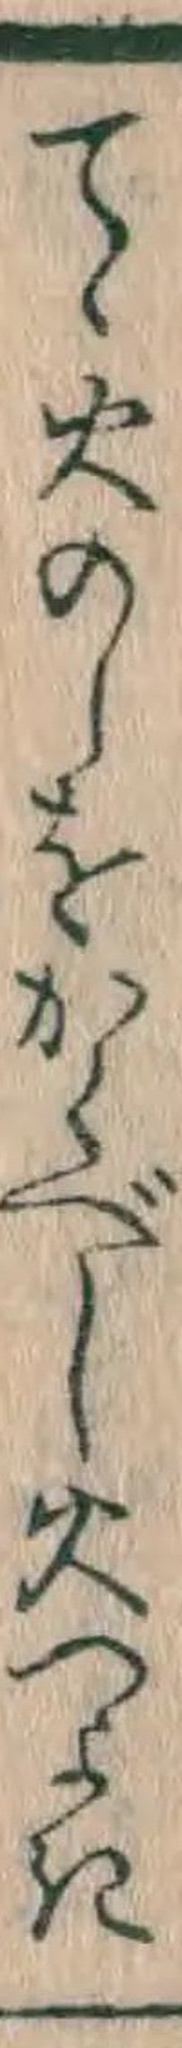てゝ火のしをかくべし火つよき
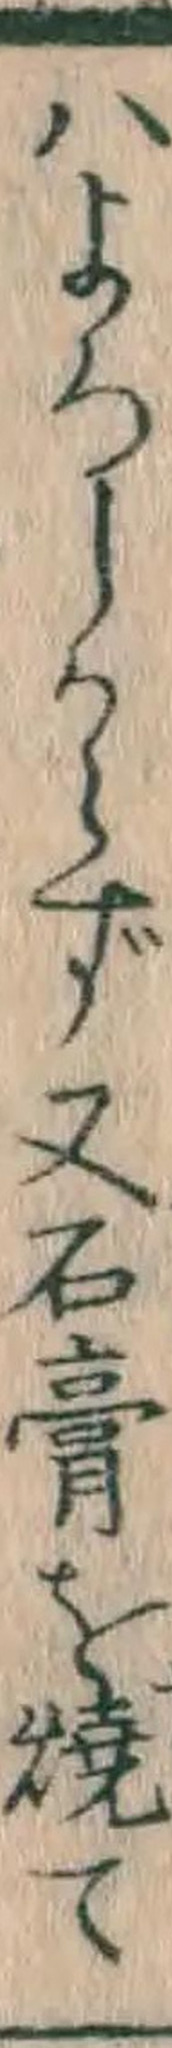はよろしからず又石膏を焼て
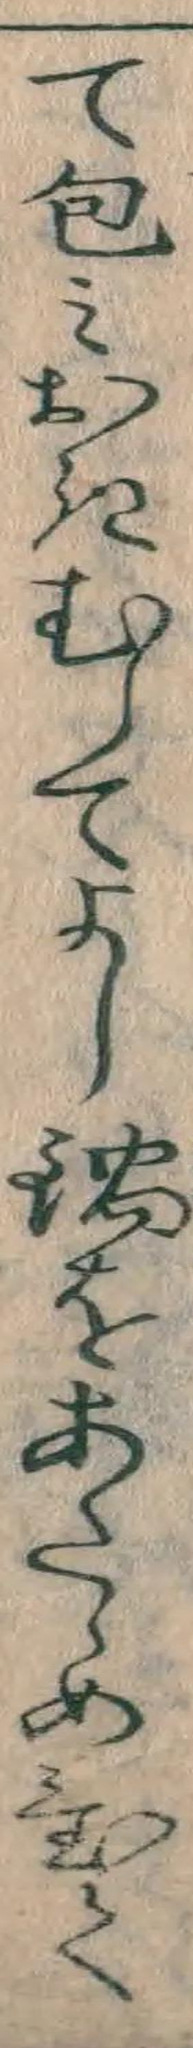て包みおきむしてよし鍋をあたゝめ置て
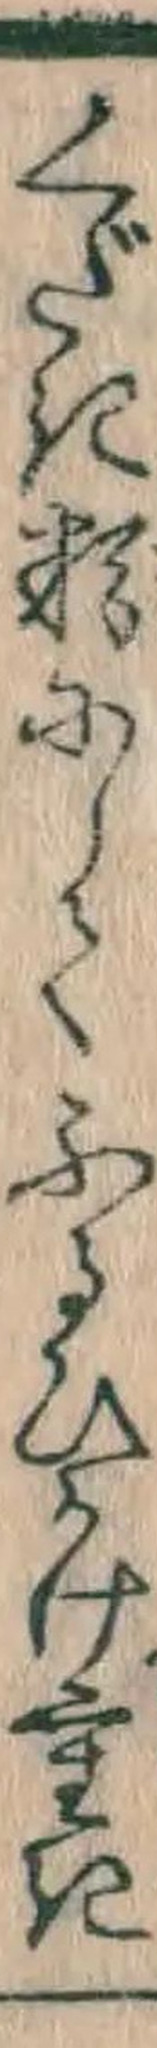くだき粉にしてふるひかけ重き
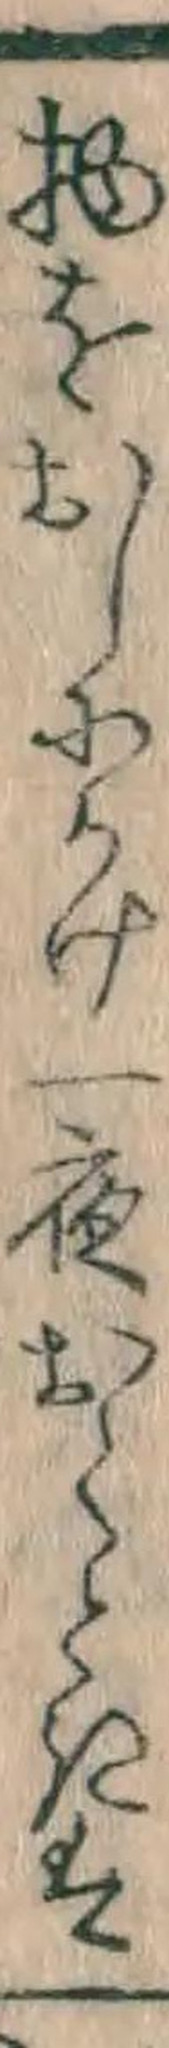物をおしにかけ一夜おくときは
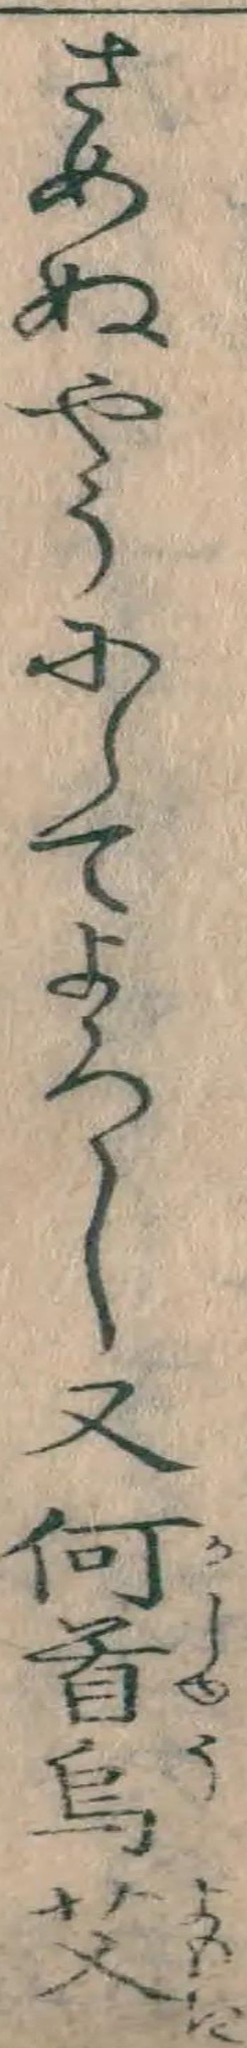さめぬやうにしてよろし又何首烏艾
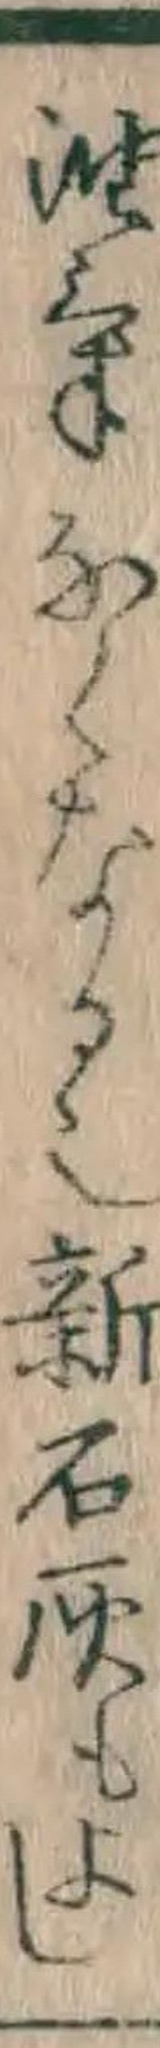油気なくなる也新石灰もよし
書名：広益秘事大全 3巻. [3]
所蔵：国立国会図書館 National Diet Library, JAPAN
